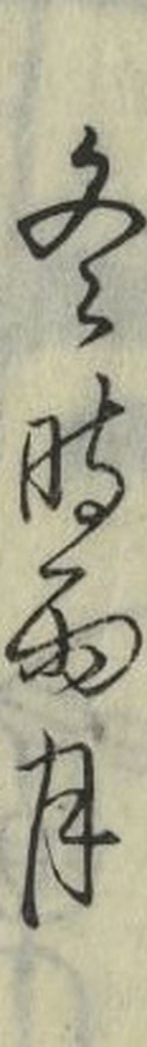冬時雨月
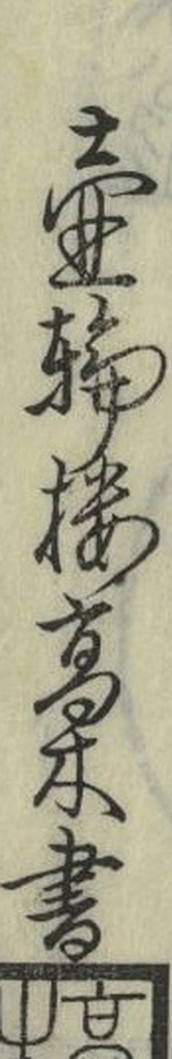壷輪楼高木書

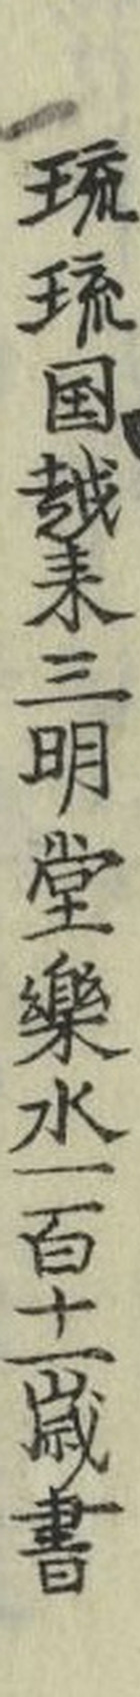琉球国越来三明堂楽水一百十一歳書
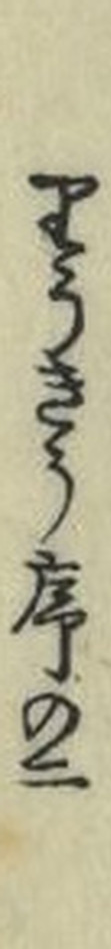りうきう序の二
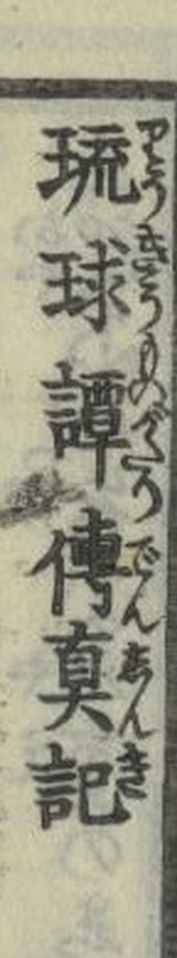琉球譚伝真記
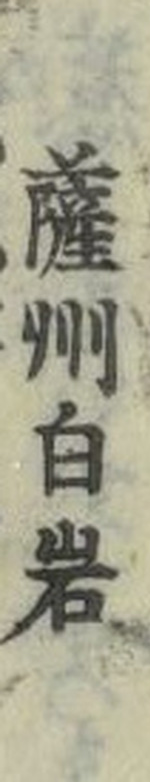薩州白岩
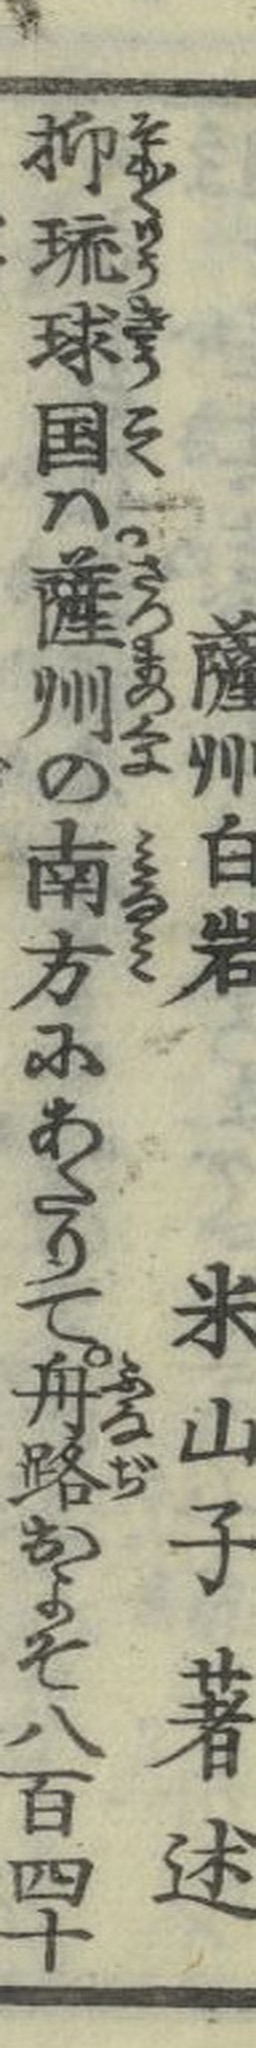抑琉球国は薩州の南方にあたりて・舟路およそ八百四十
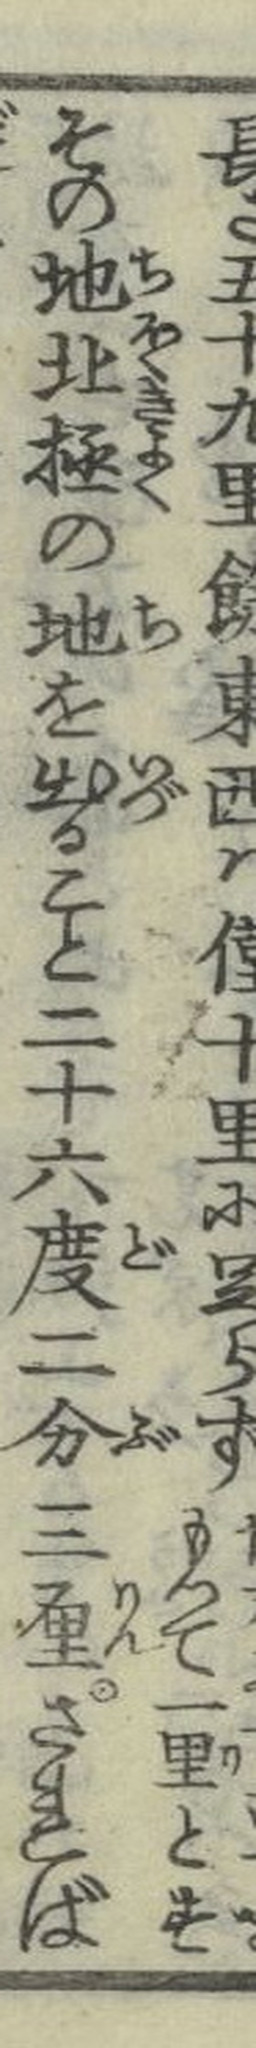その地北極の地を出ること二十六度二分三厘。されば
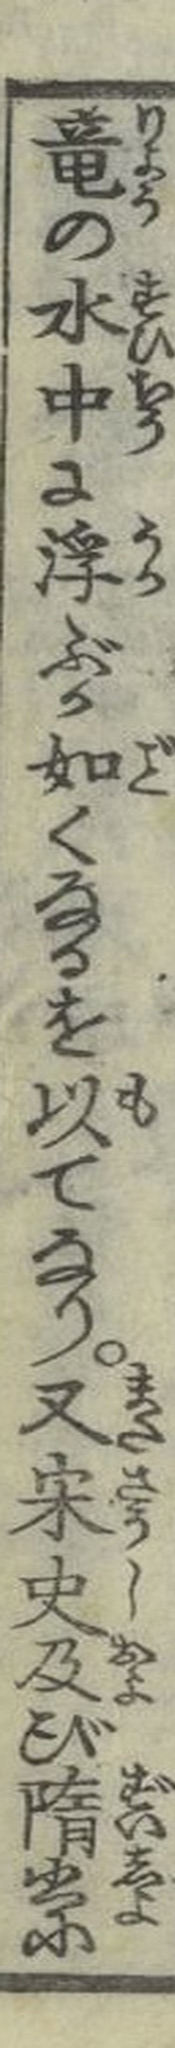竜の水中に浮ぶか如くなるを以てなり。又宋史及び隋書に

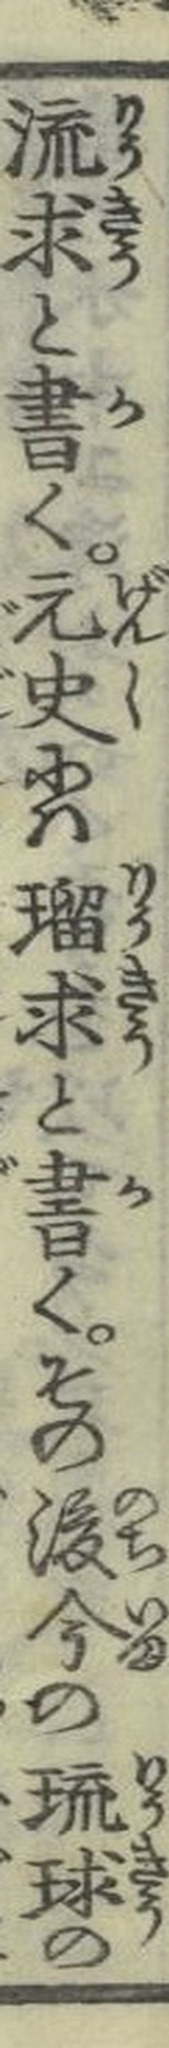流求と書く。元史には瑠求と書く。その後今の琉球の
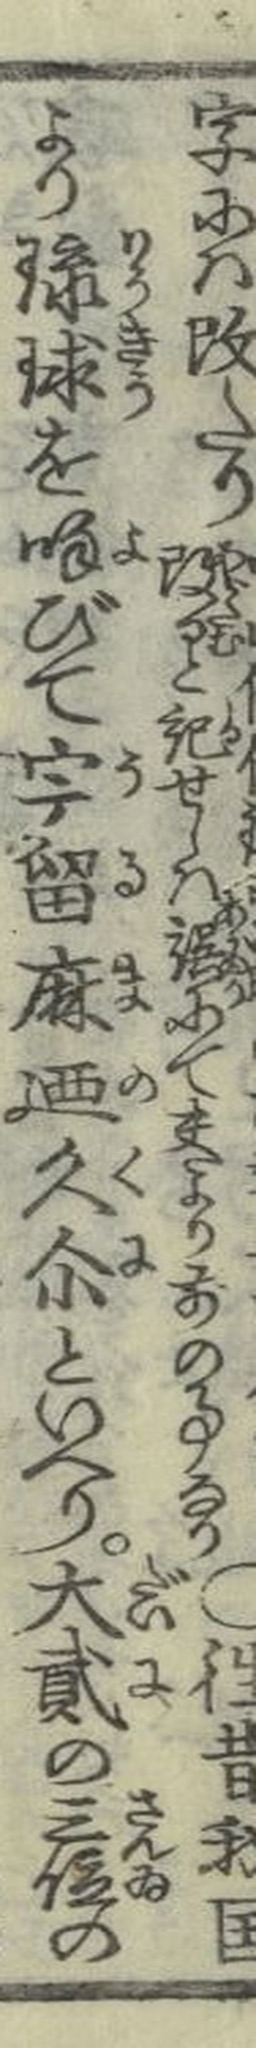より琉球を呼びて宇留麻廼久尓といへり。大弐の三位の
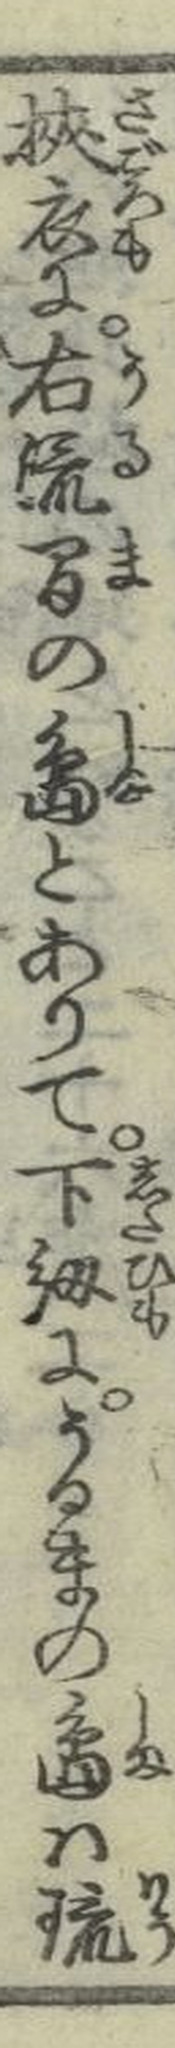狭衣に。右流間の島とありて。下紐に。うるまの島は琉
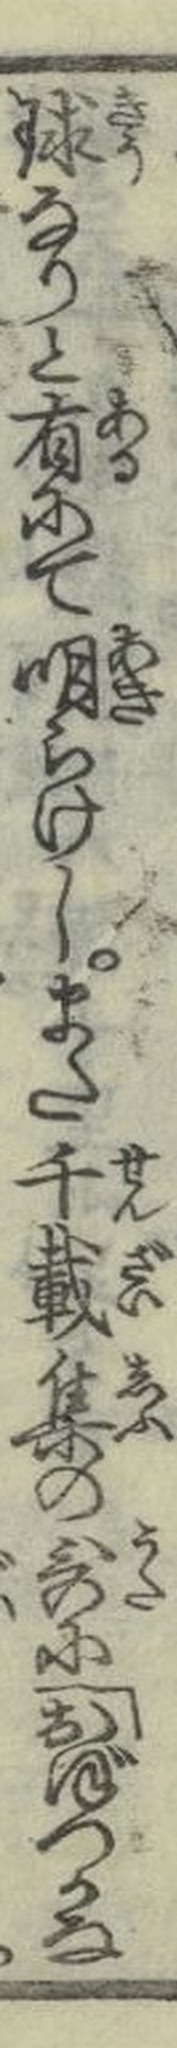球なりと有にて明らけし。また千載集の歌に「おぼつかな
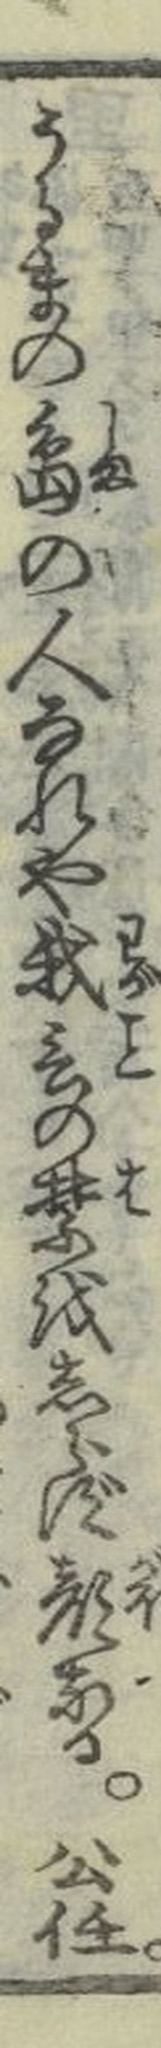うるまの島の人なれや我言の葉をしらず顔なる。公任。
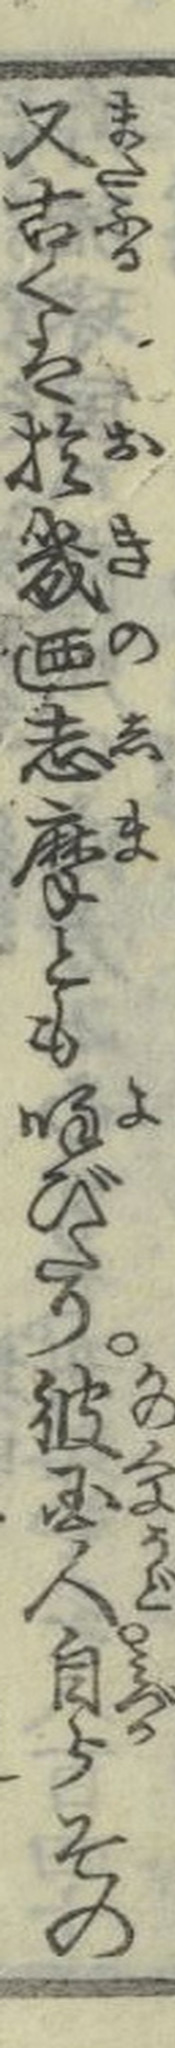又古くは於幾廼志摩とも呼びたり。彼国人。自らその
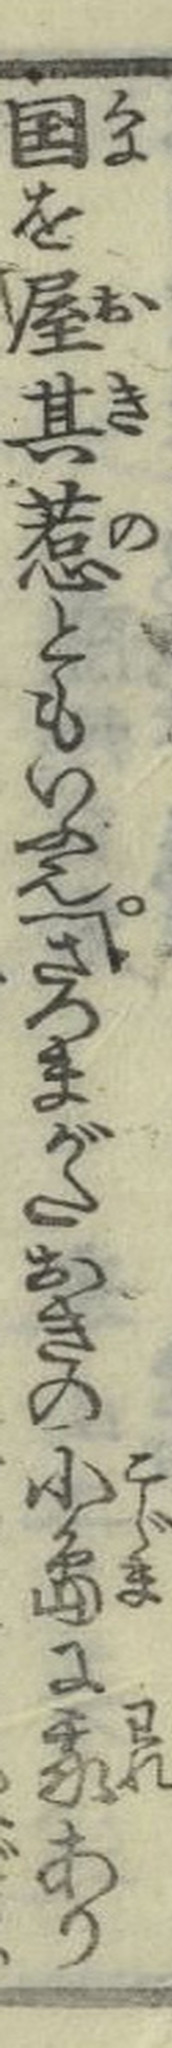国を屋其惹ともいふ也「さつまがたおきの小島に我あり
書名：琉球奇譚
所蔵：University of the Ryukyus Library
